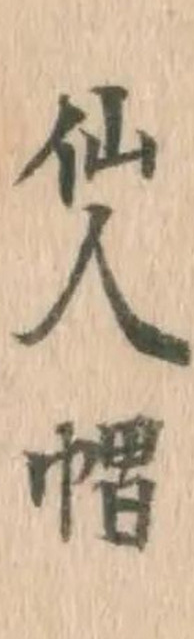仙人帽
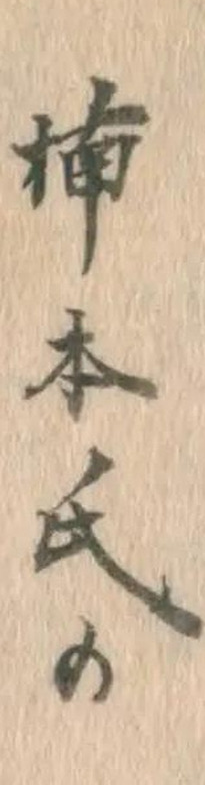楠本氏の

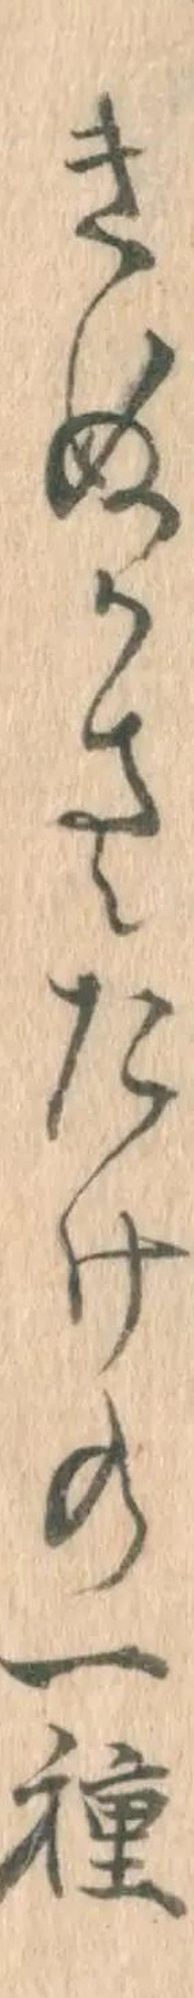きぬかさたけの一種
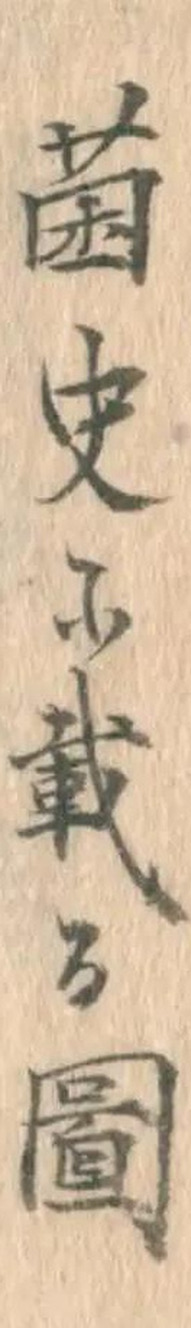菌史に載る図
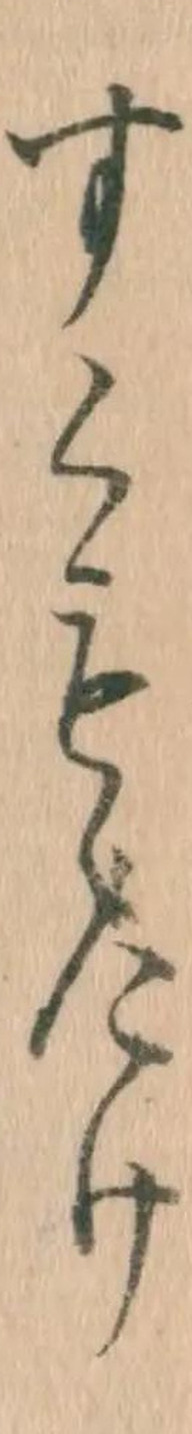すくもたけ
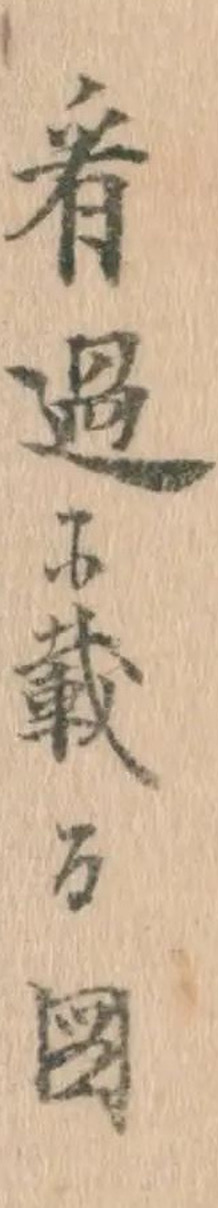看過に載る図
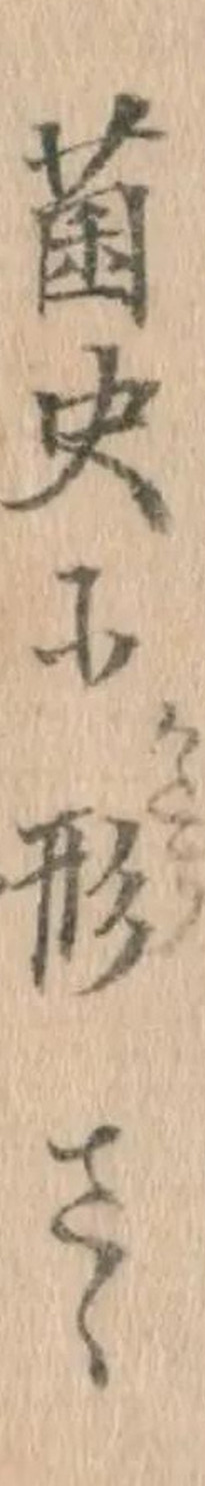菌史に形さゝ
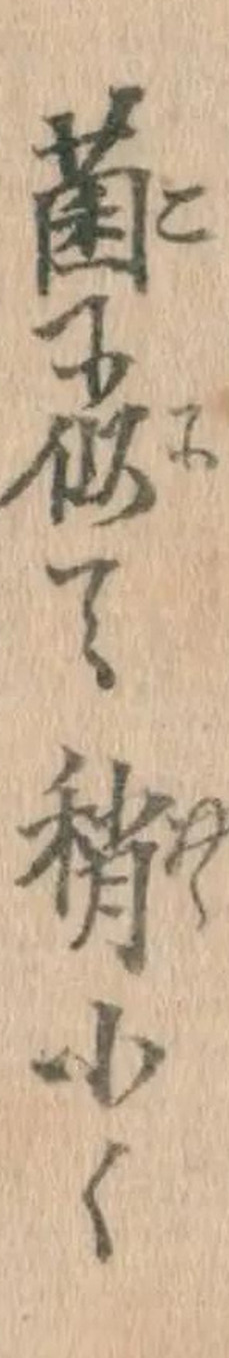菌に似て稍小く
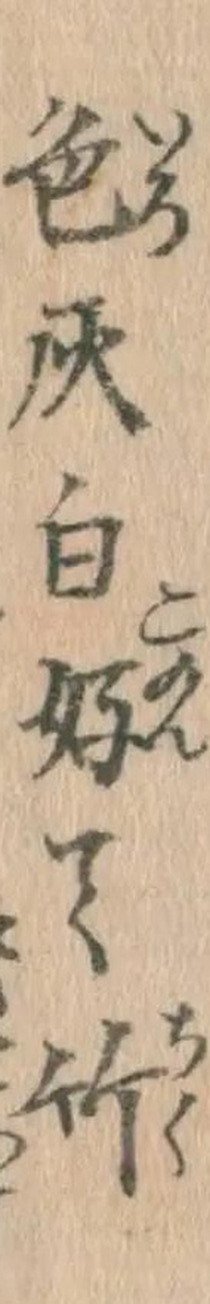色灰白好て竹
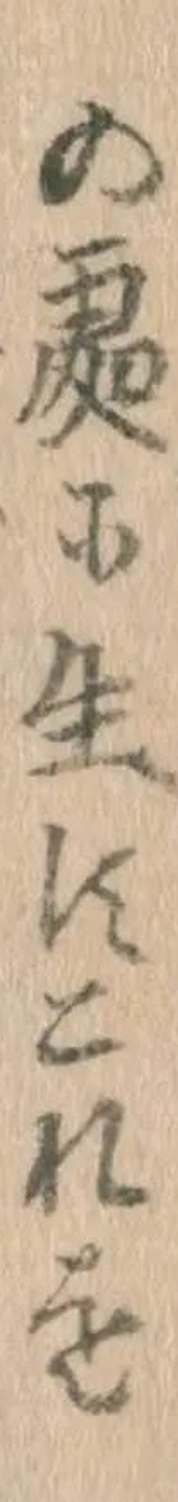の処に生すこれを
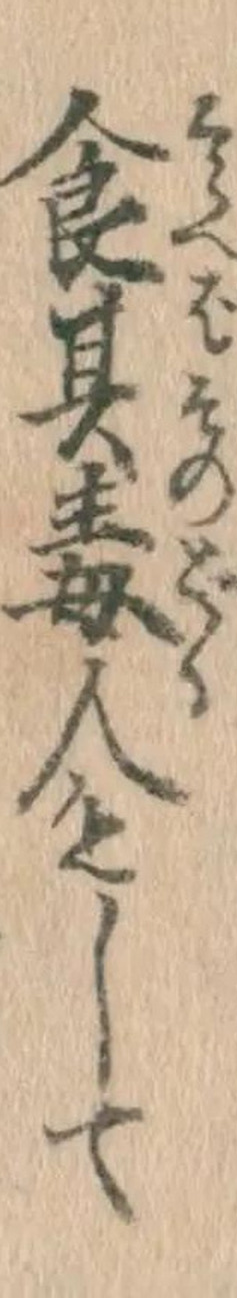食其毒人をして
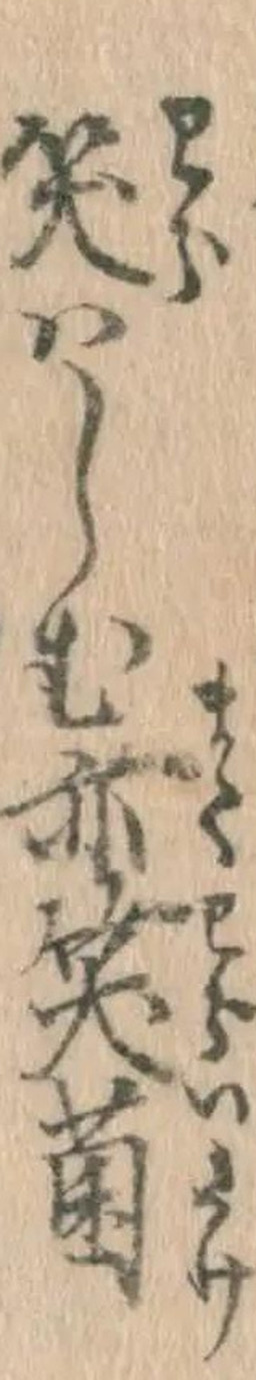笑はしむ亦笑菌
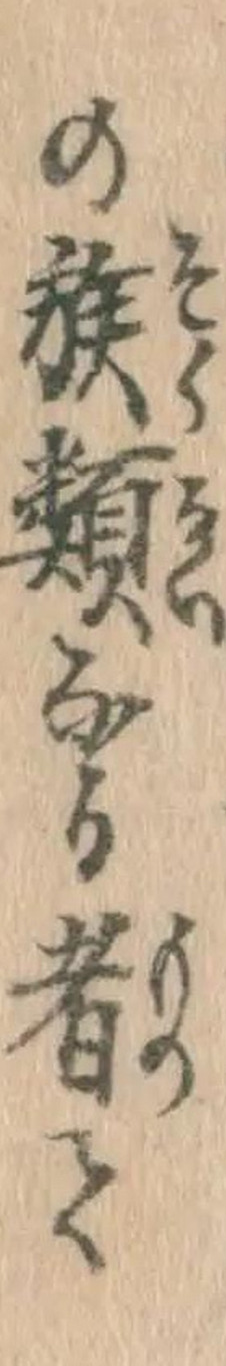の族類なる者と
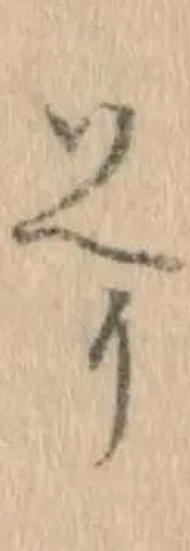いへり

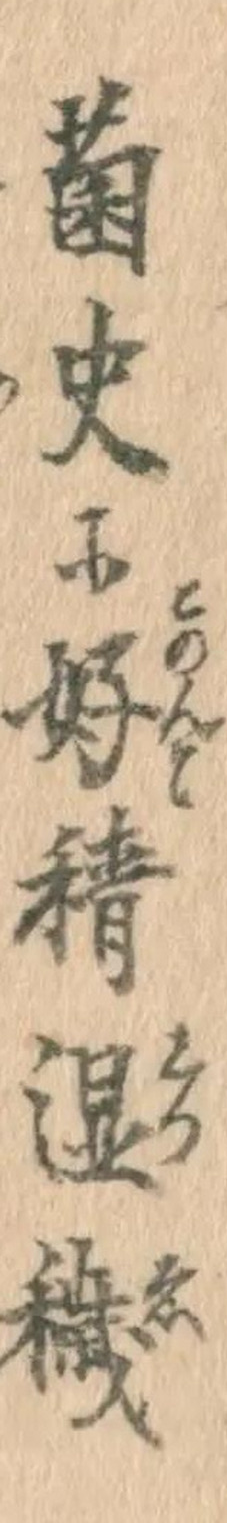菌史に好積湿穢
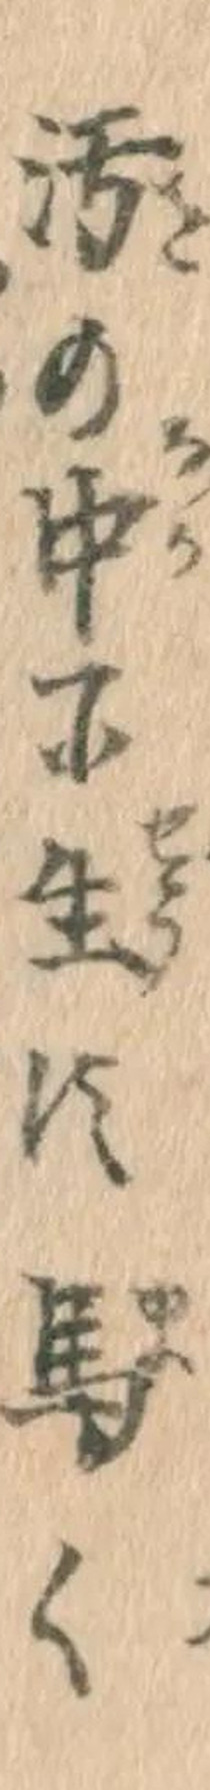汚の中に生す馬く
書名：本草図譜. 巻58-60
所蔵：国立国会図書館 National Diet Library, JAPAN
